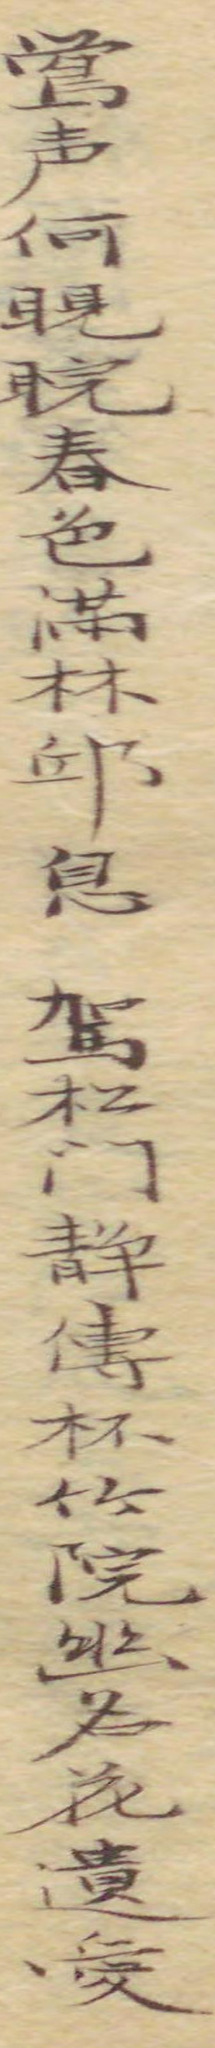鴬声何睍睆春色満林邱息駕松門静傳杯竹院幽名花遺愛
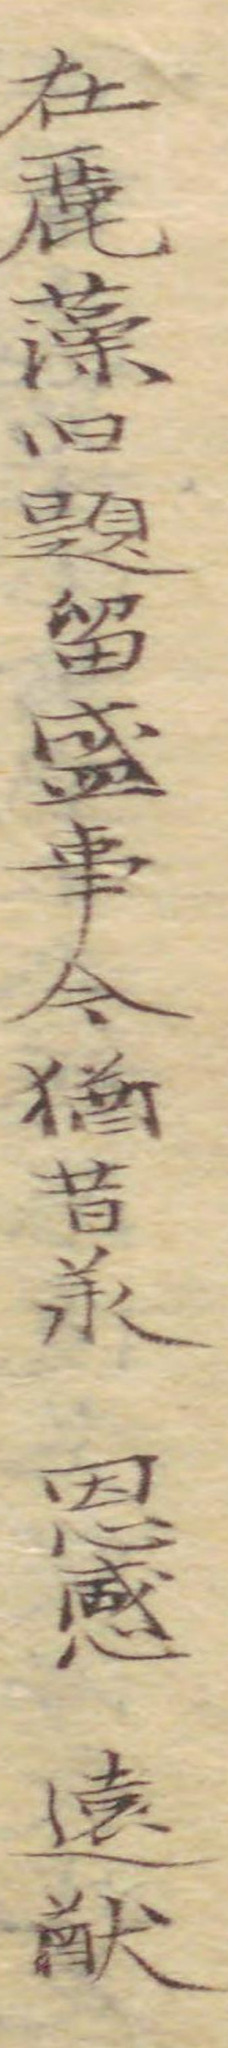在麗藻旧題留盛事今猶昔承恩感遠猷
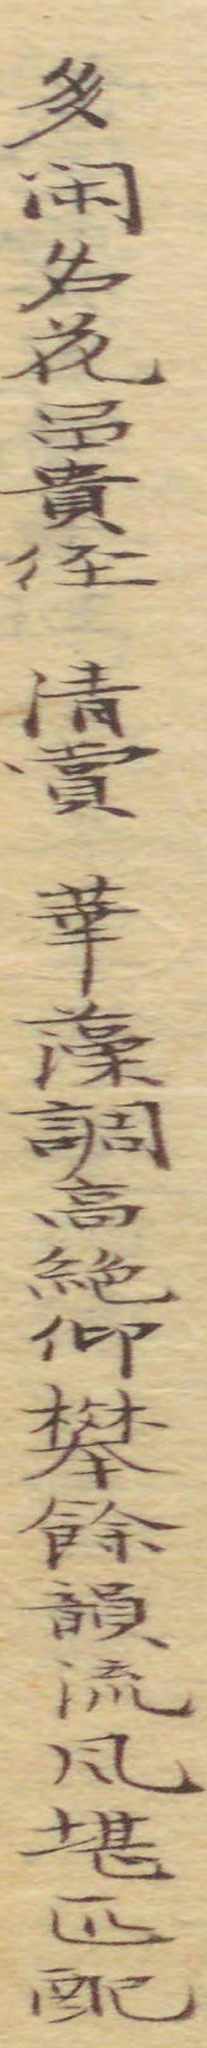多閑名花品貴径清賞華藻調高絶仰攀餘韻流風堪匹配

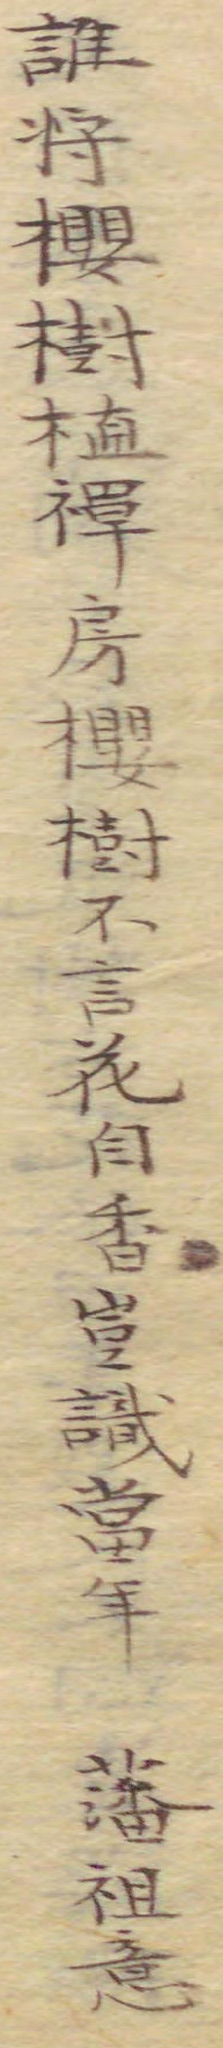誰狩桜樹植禅房桜樹不言花自香豈識当年藩祖意
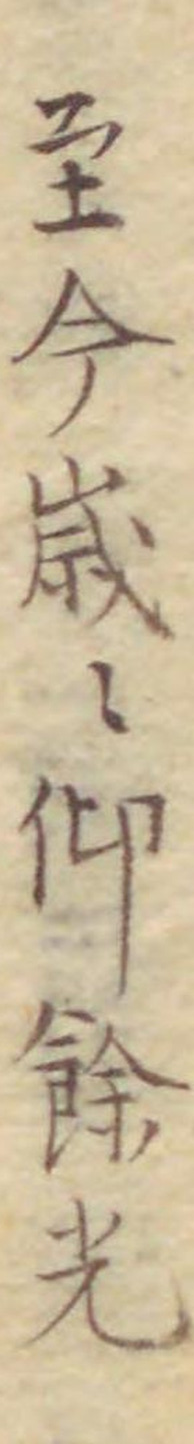至今歳〻仰余光
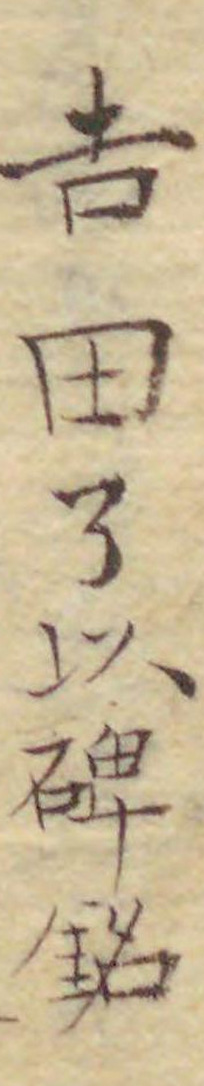吉田了以碑銘
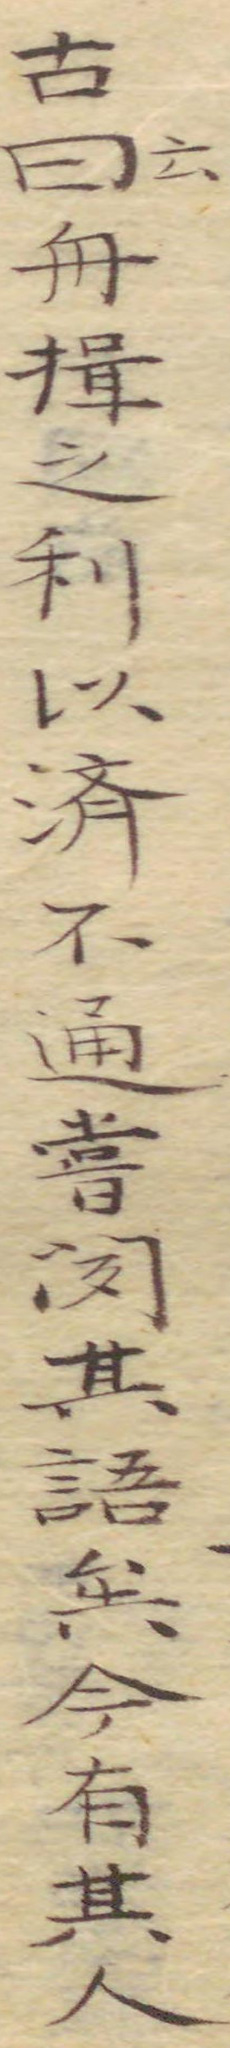古曰舟楫之利以済不通嘗聞其語矣今有其人
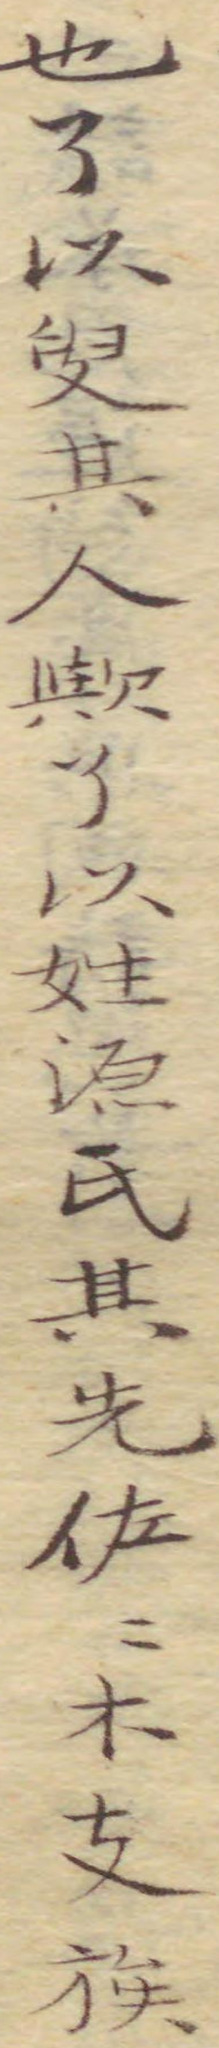也了以叟其人歟了以姓源氏其先佐〻木支族
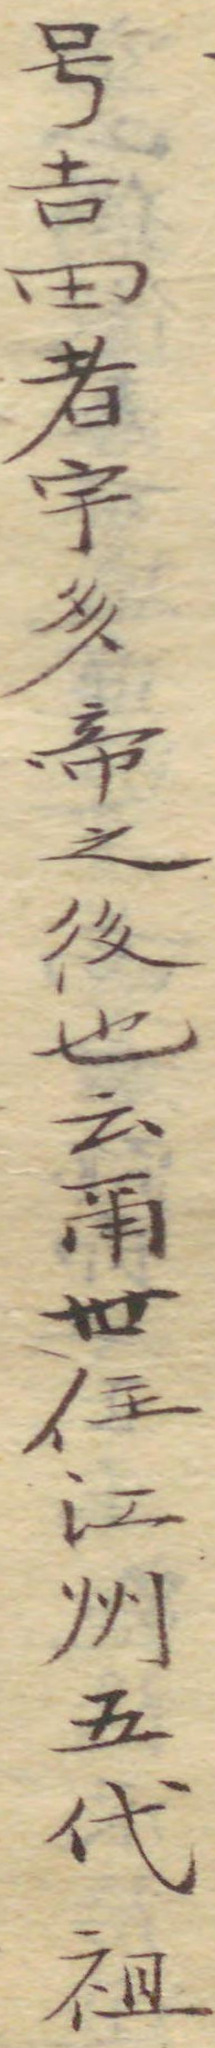号吉田者宇多帝之後也云爾世住江州五代祖
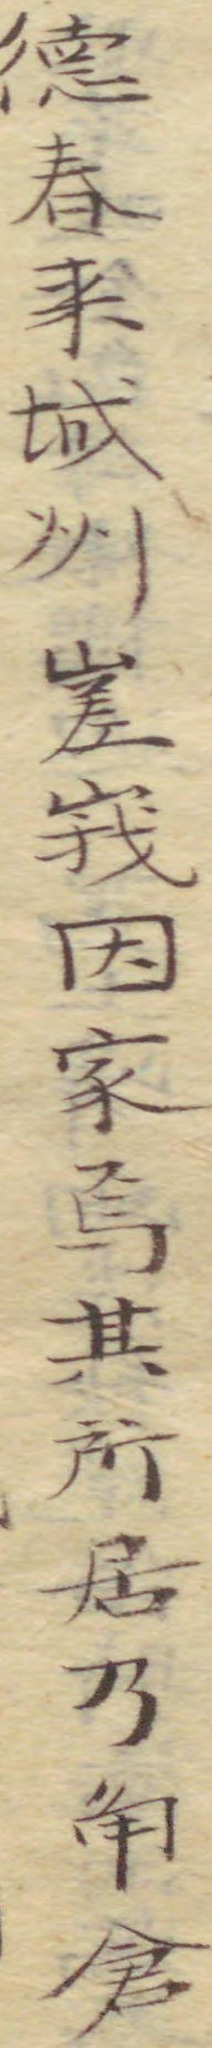徳春来城州嵯峨因家焉其所居乃角倉
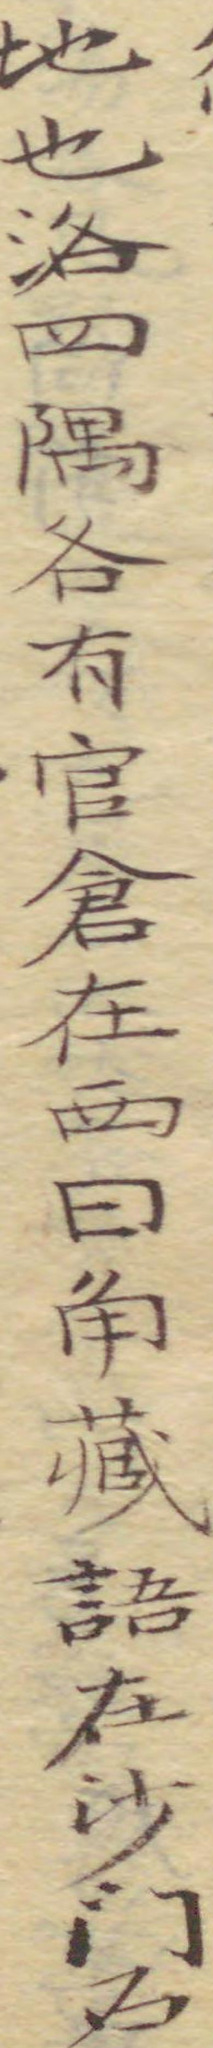地也洛四隅各有官倉在西曰角蔵語在沙門石
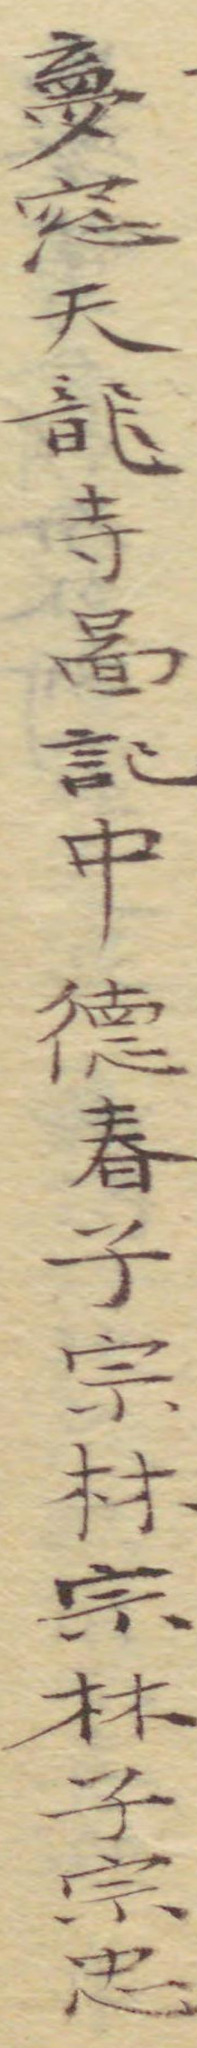夢窓天龍寺図記中徳春子宗林宗林子宗忠
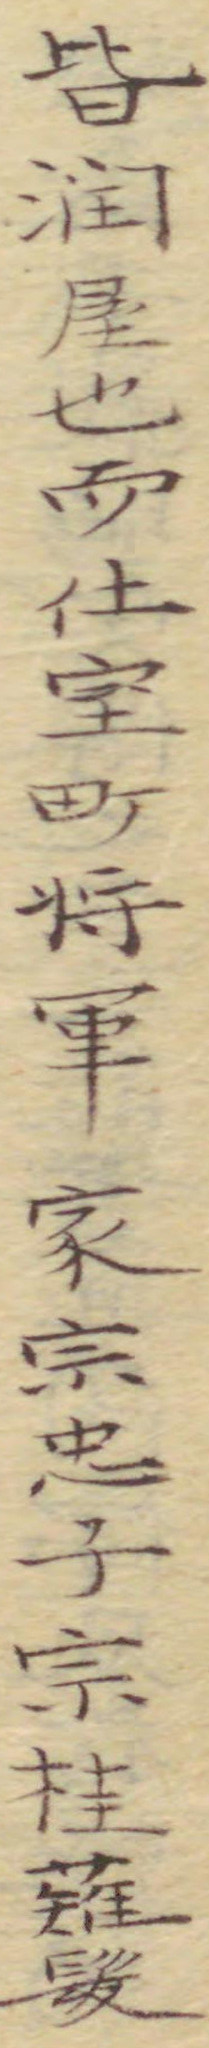皆潤屋也而仕室町将軍家宗忠子宗桂薙髪
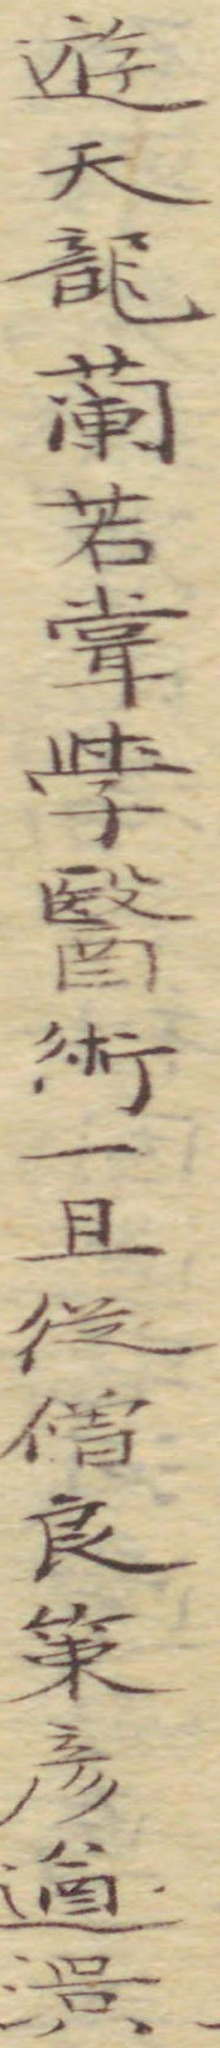遊天龍蘭若甞学医術一旦従僧良策彦遒洖
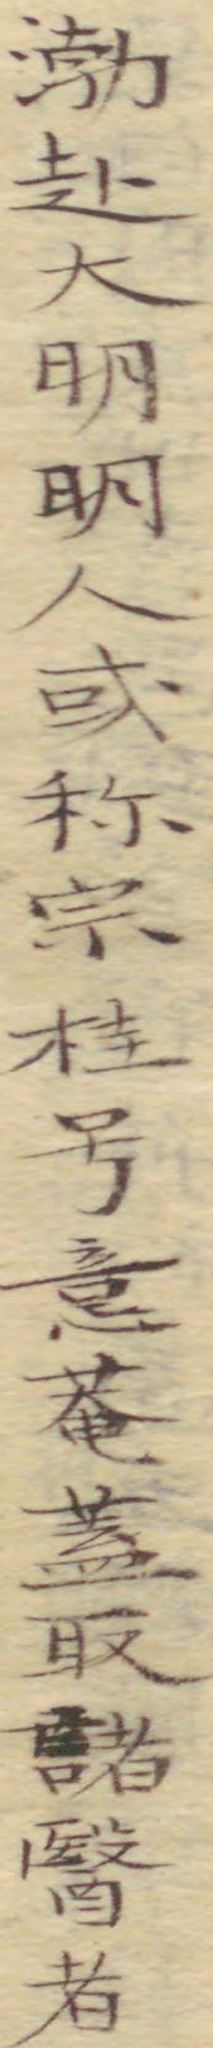渤赴大明明人或称宗桂号意菴蓋取諸医者
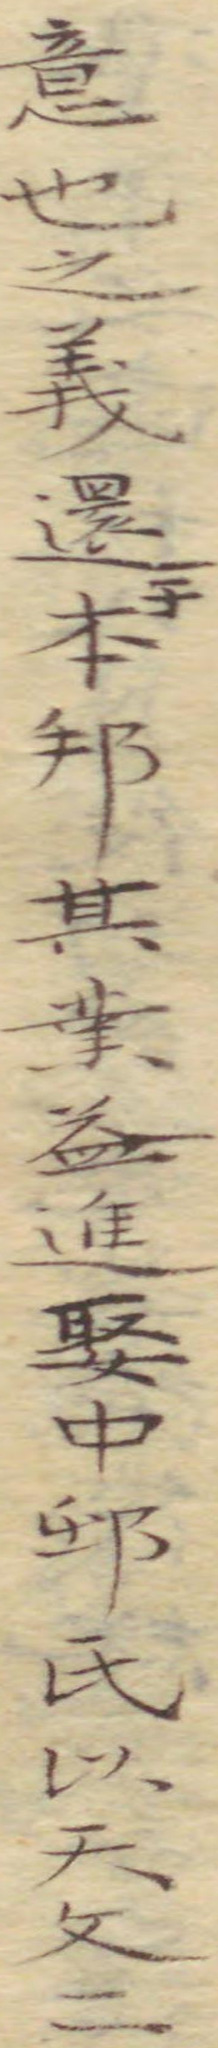意也之義還于本邦其業益進娶中邨氏以天文二
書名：鶯宿雑記. 巻263-264
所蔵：国立国会図書館 National Diet Library, JAPAN
